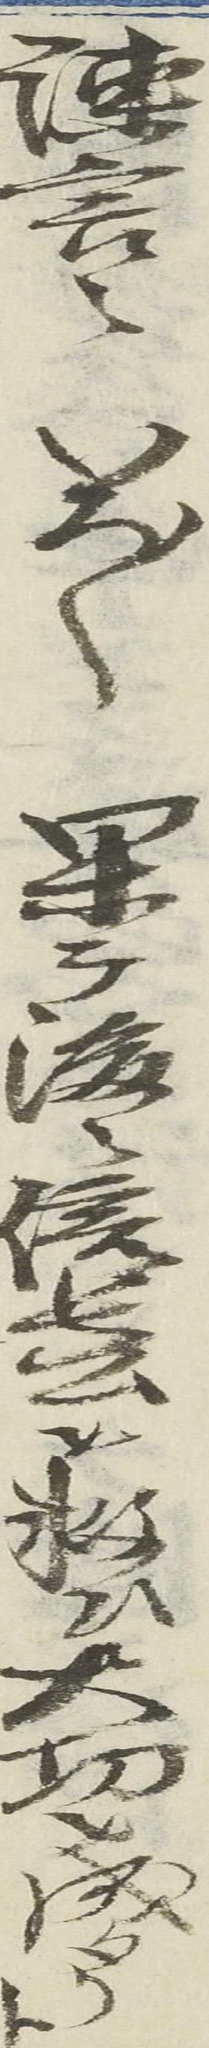諫言シいろ〳〵果テ後之信長公ヲ救ひ大功ヲ成タリト
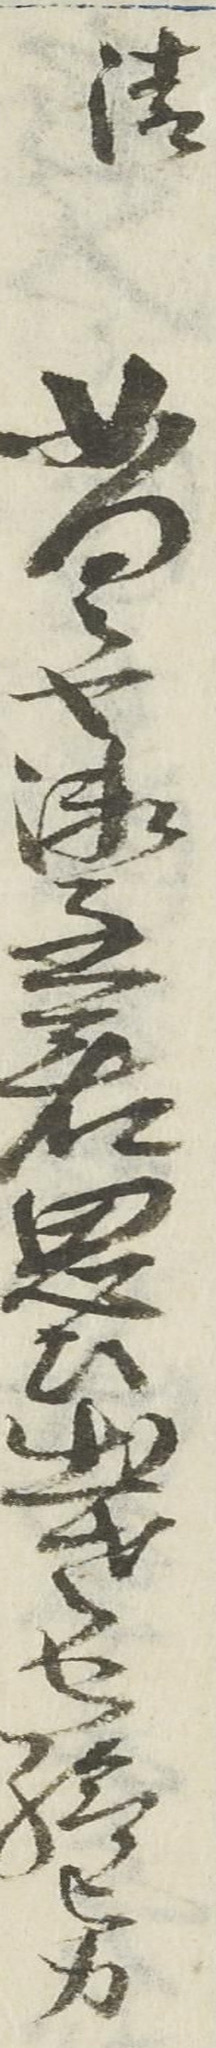清如何ニヤ御主君思ひ出さセ給ヒカ
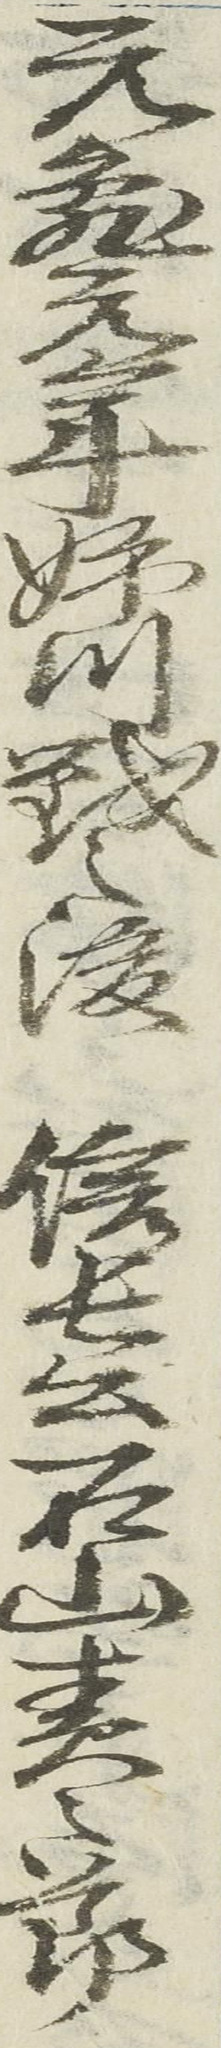元亀元年姉川戦之後信長公石山責之節
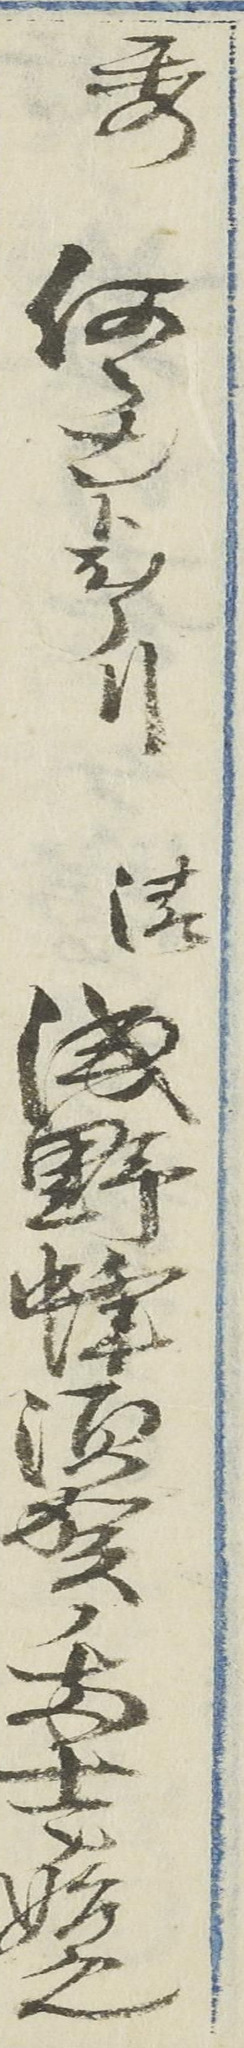秀何ノナント云うリ清浅野蜂須賀ノ両士ヲ始め
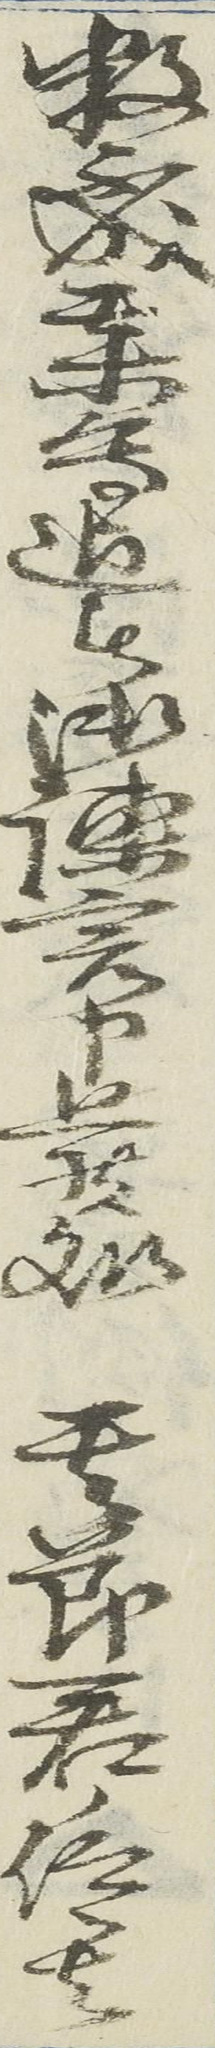数不成某等迄も御諫言申上候処其節君ノ仰候は
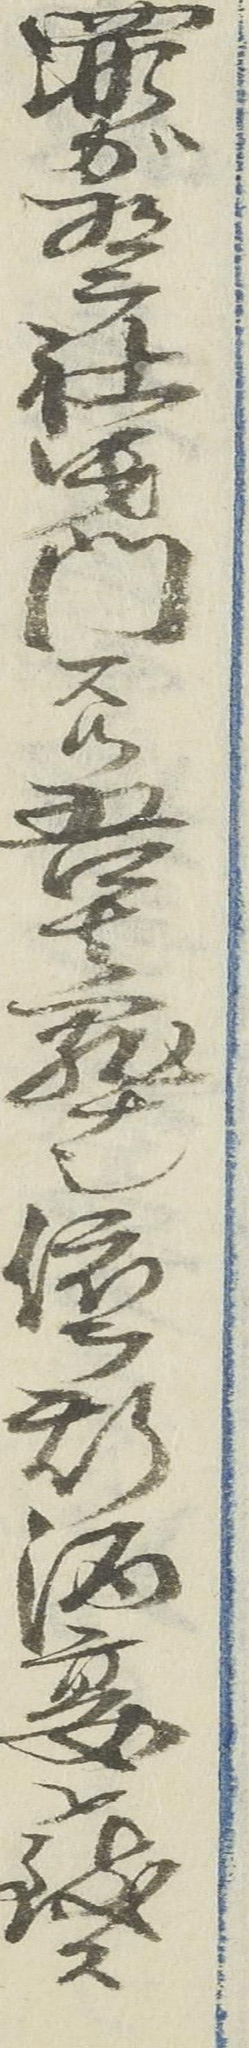罪が有テ社閉門スル吾は罪ナシ依テ斯酒宴ヲ致ス

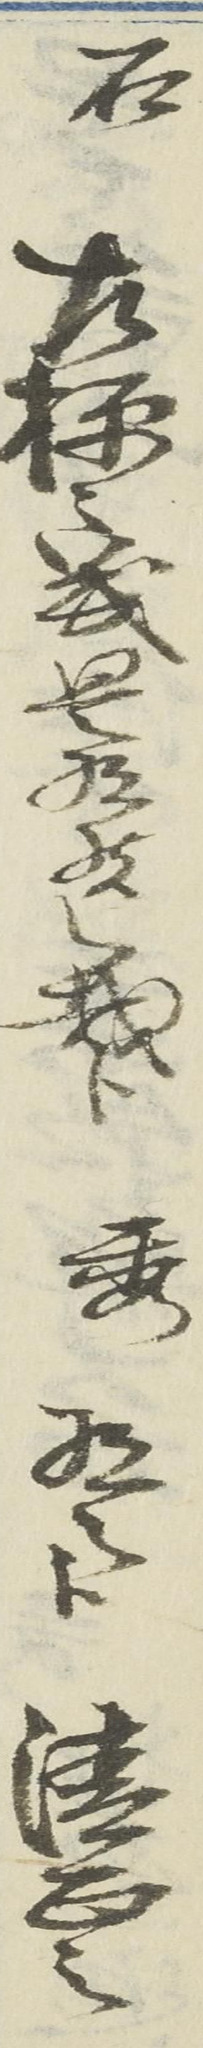石左様之義是有候之義ト秀有之ト清正之
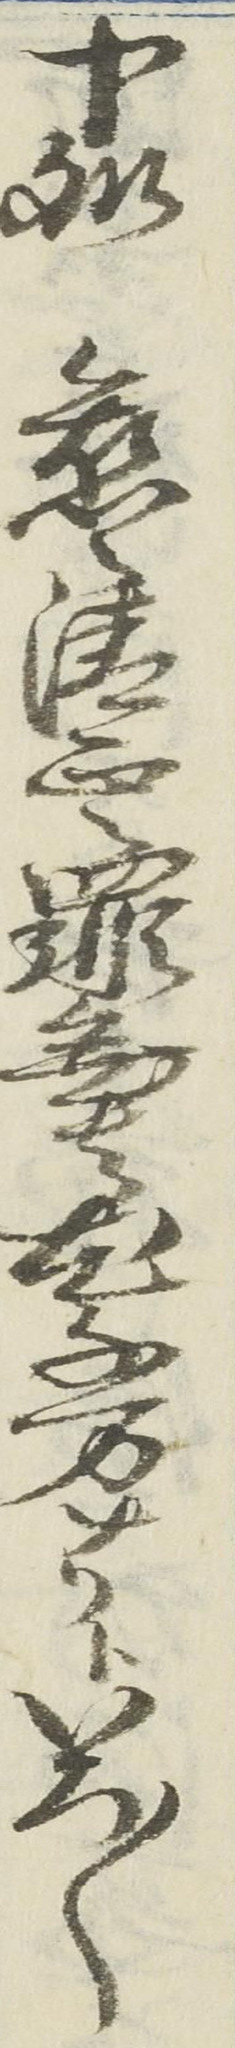申処之清正之罪無は尤千万ナリトいろ〳〵
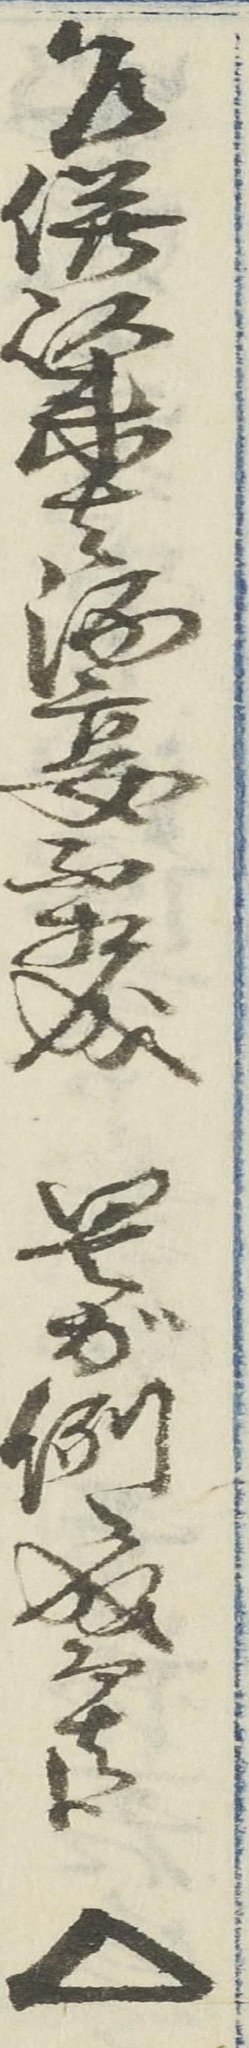乍併以来は酒宴不相成是が例ニ成而はト
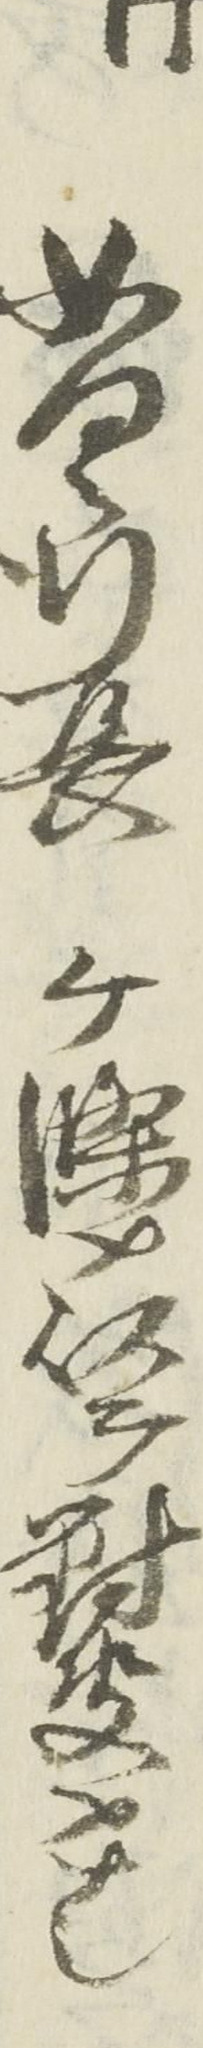片如何行長ケ條ヲ以対決ヲナシ
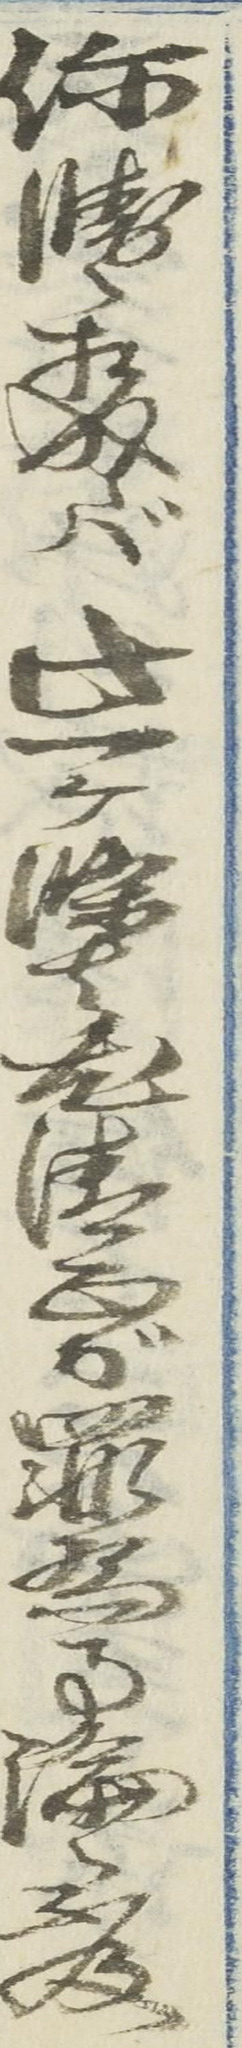你勝ニ相成バ此一ケ條は尤清正が罪為事論ニ不及
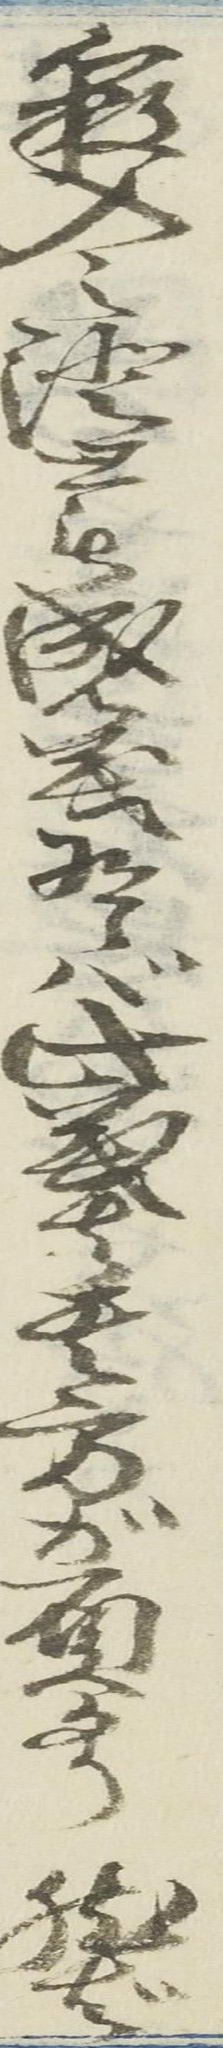藪入之證とも成ル義有らバ此義は其方が負たり然ば
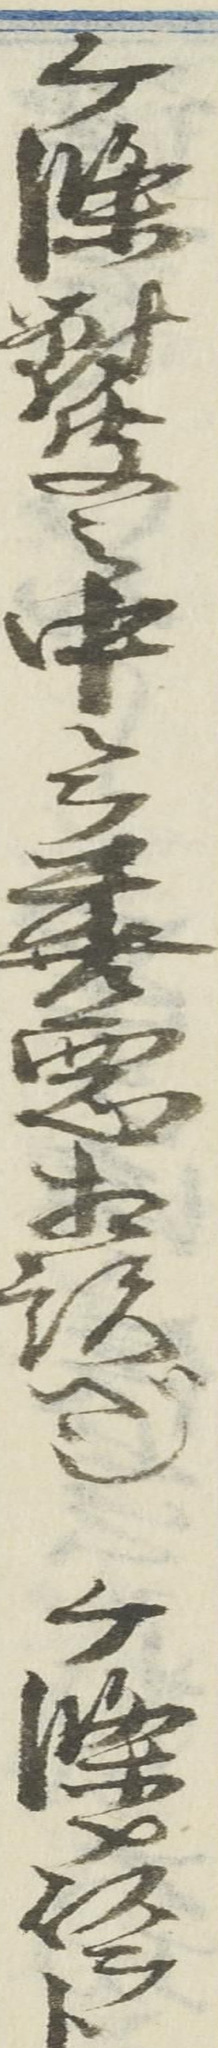ケ條対決之中ニテ善悪相訳ベシケ條ヲ以テト
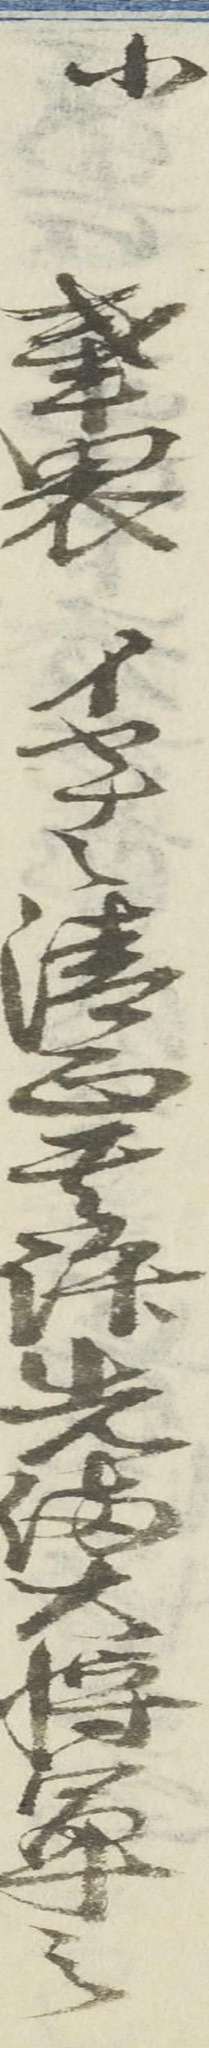小奉畏イヤナニ清正其許先備大将軍之
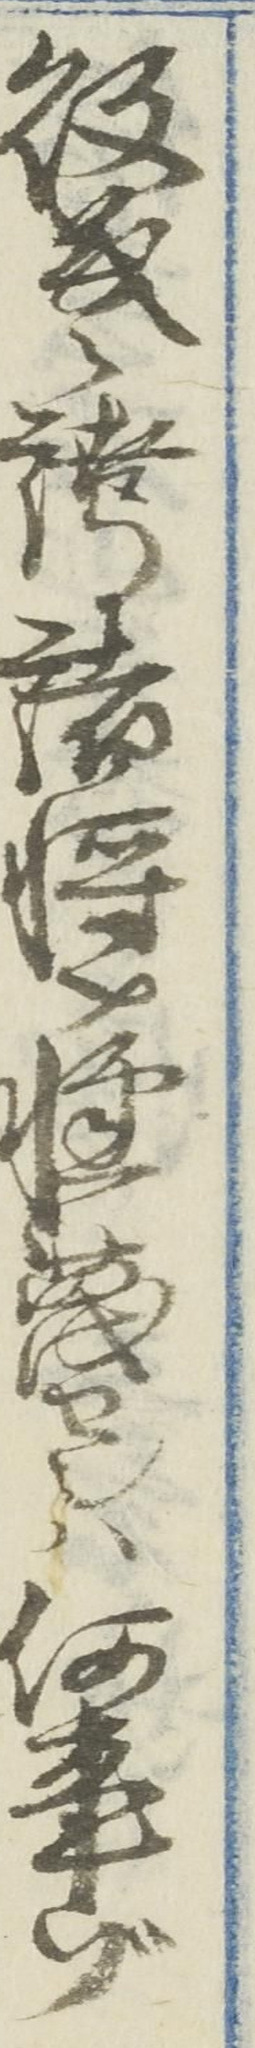役義ニ誇諸将ヲ軽蔑セシハ何事ゾ
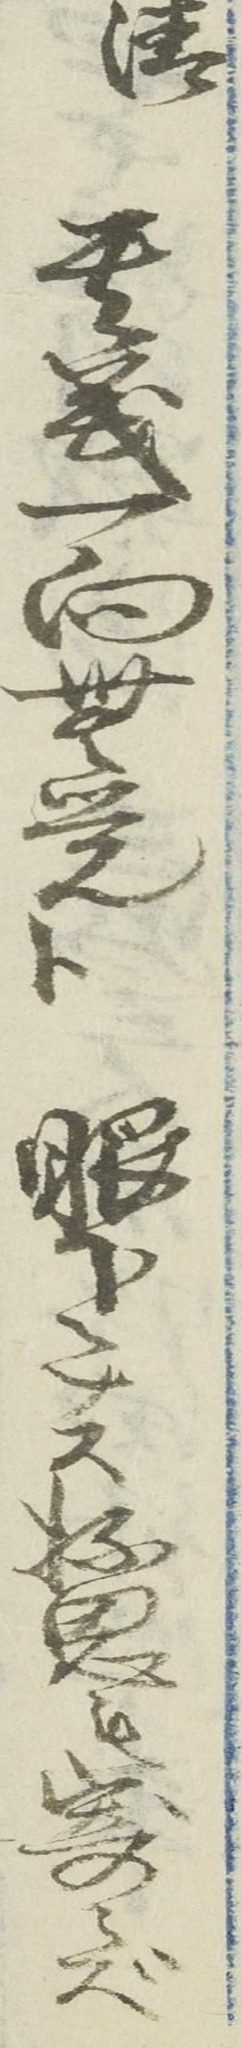清其義一向無覚ト眼下ニナス抔思も寄らズ
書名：伏水大地震
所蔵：東京大学地震研究所図書室 Earthquake Research Institute Library, The University of Tokyo, JAPAN
